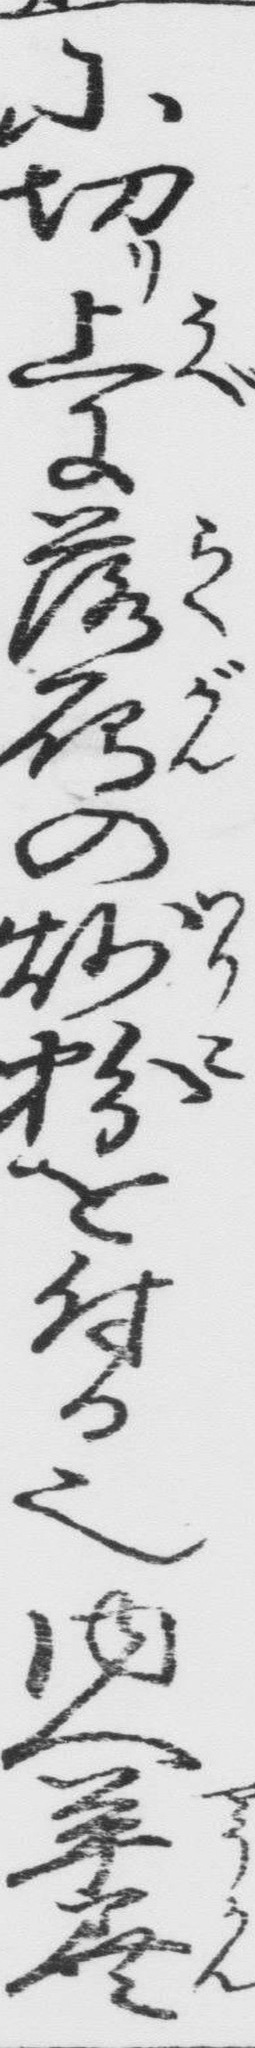に切り上に落雁の炒粉を付る也内へ羊羹
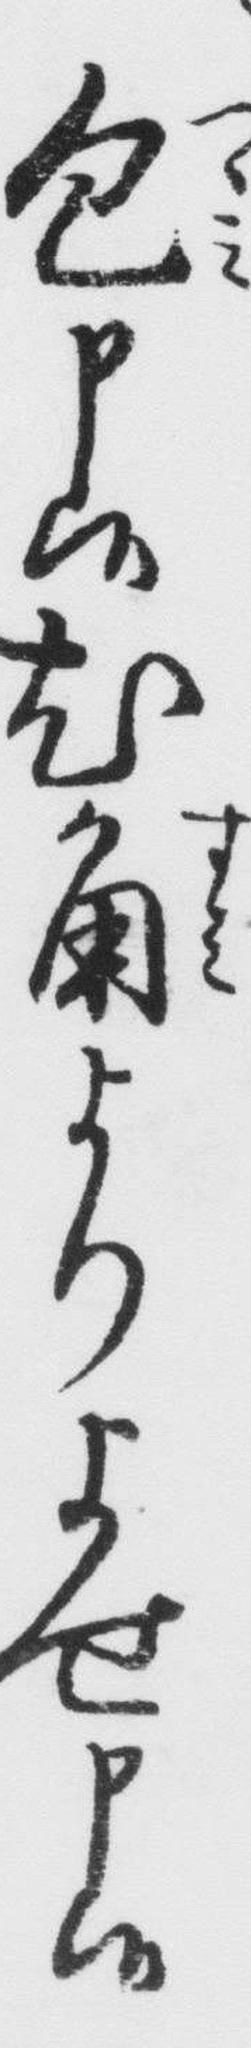包申候尤角よりよせ申候
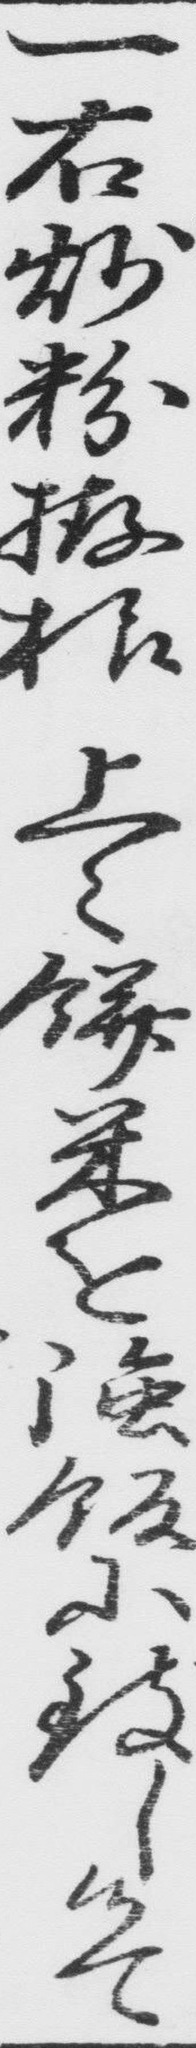一右炒粉拵様上々餅米を強飯に致し候て
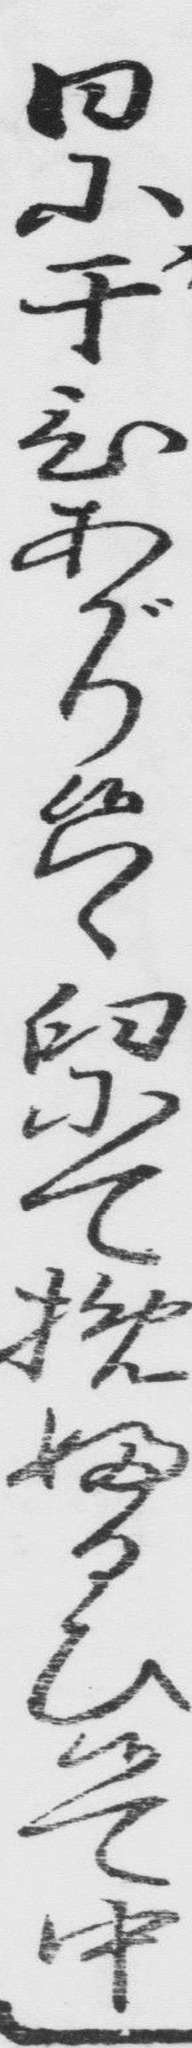日に干ひあがり候はゝ臼にて挽ふるひ候て中

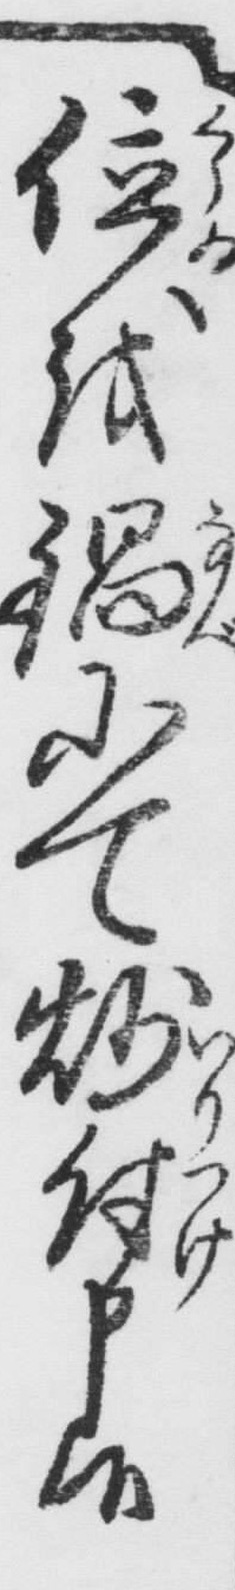位を鍋にて炒付申候
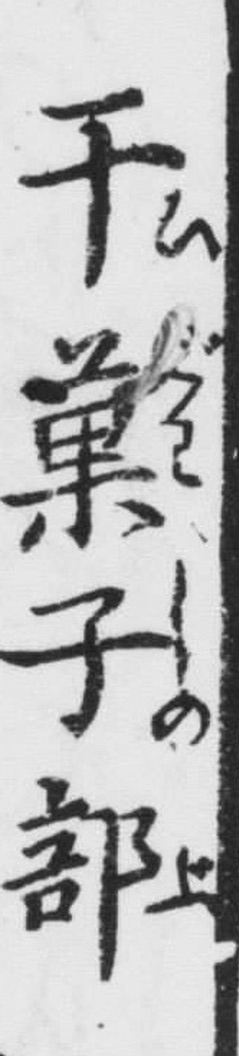干菓子部
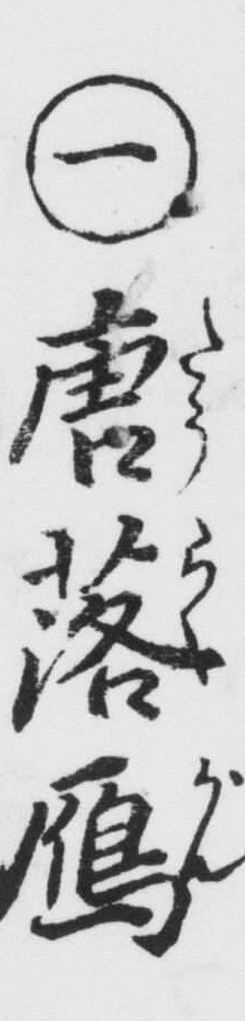(一)唐落雁
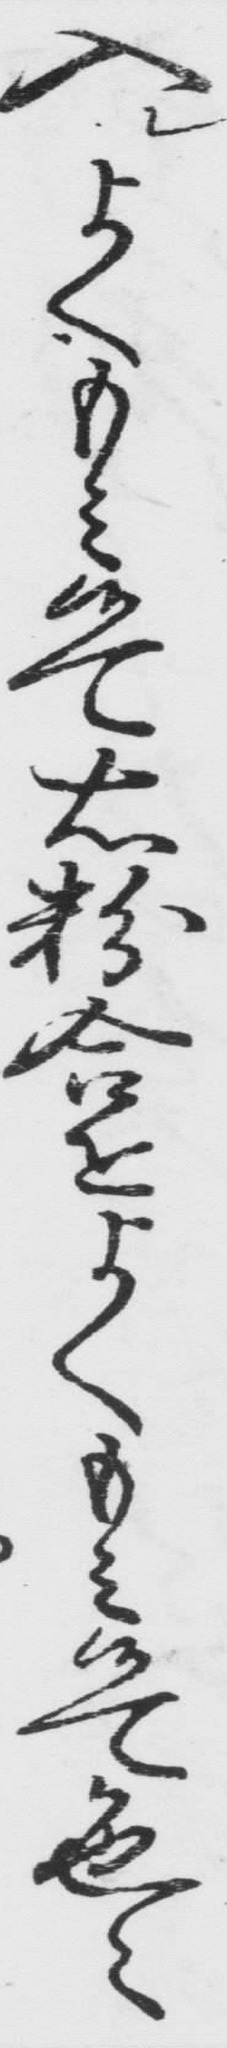入れよくもみ候て右粉合せよくもみ候て色々
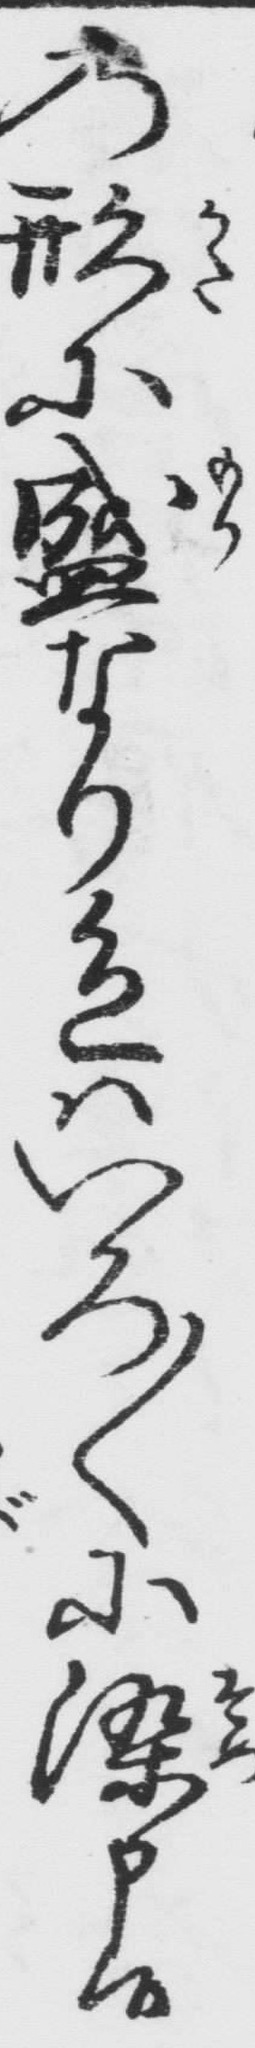の形に盛なり色はいろ〳〵に染申候
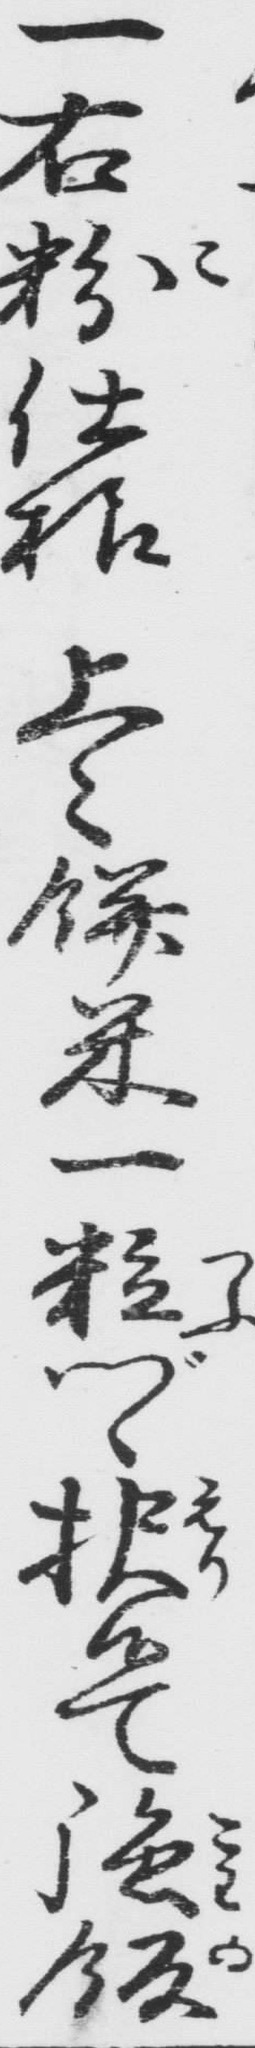一右粉仕様上々餅米一粒づゝ択候て強飯
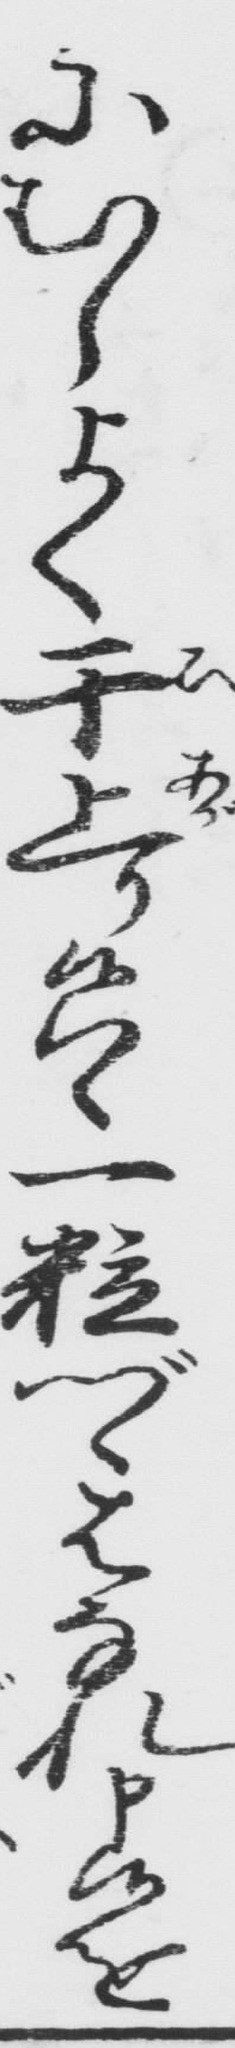にむしよく干上り候はゝ一粒づゝはなれ申候を
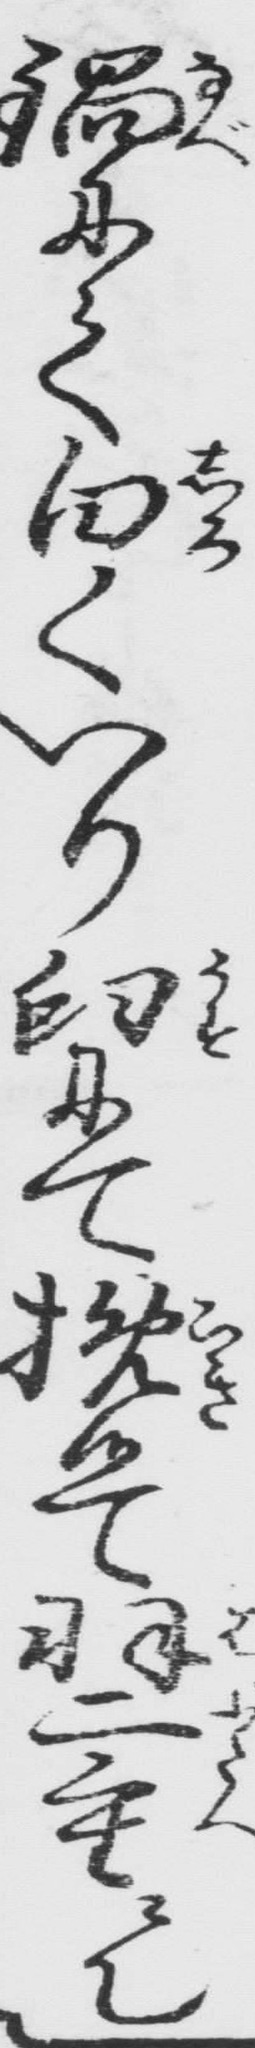鍋にて白くいり臼にて挽候て羽二重にて

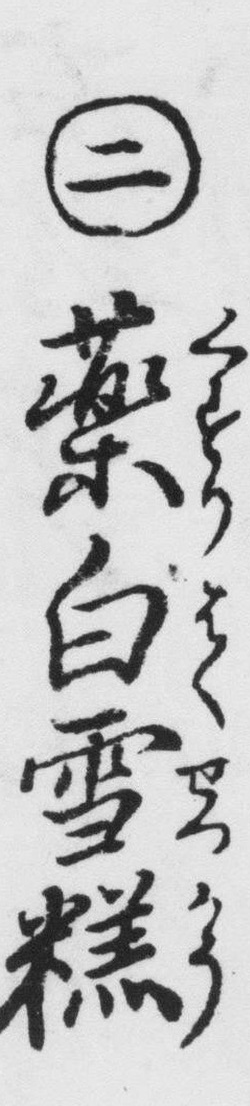(二)薬白雪糕
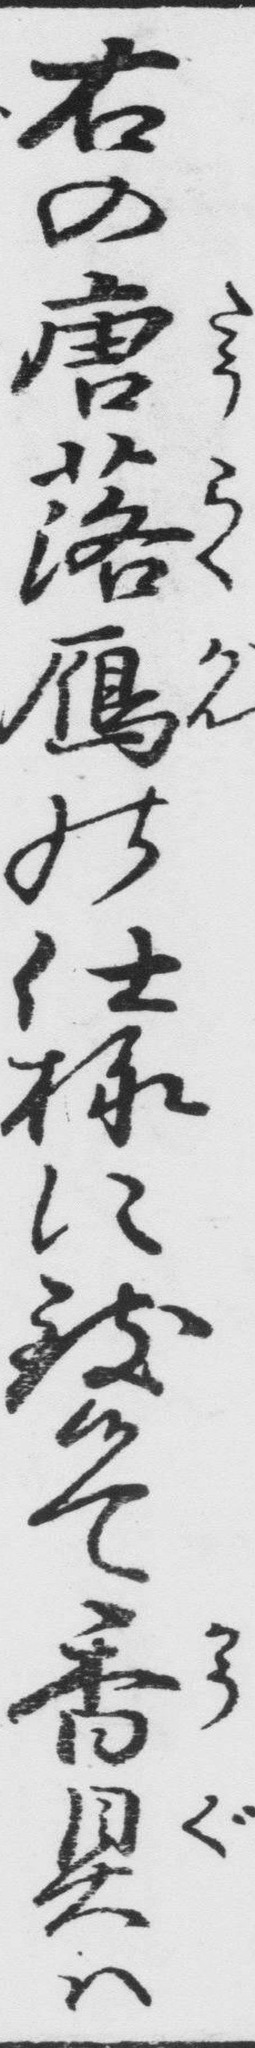右の唐落雁の仕様に致候て香具は
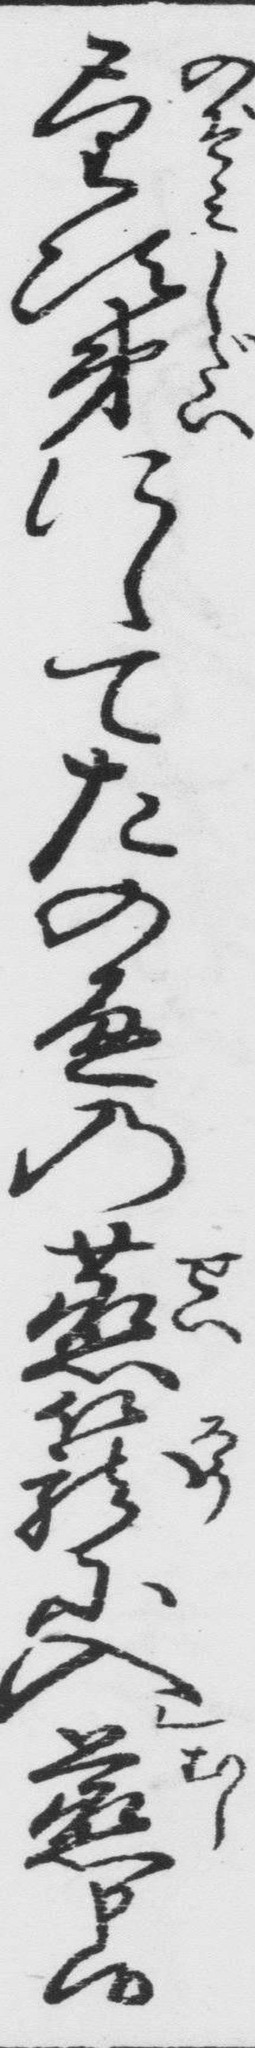望次第にして左の通の蒸籠に入れ蒸申候
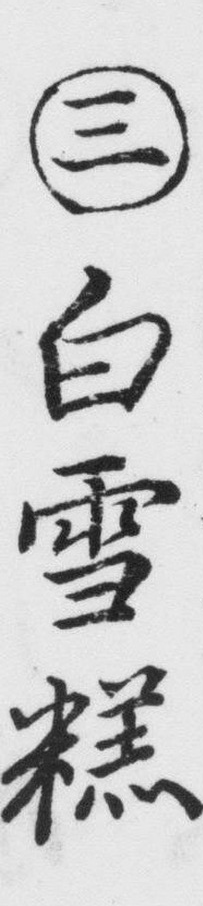(三)白雪糕
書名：御前菓子図式
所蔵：大阪府立大学学術情報センター 国文学研究資料館
